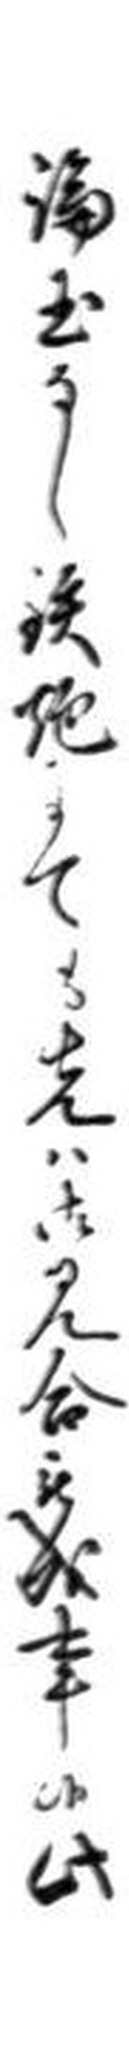論玉なし鉄炮にても先ハ御見合被成事候此
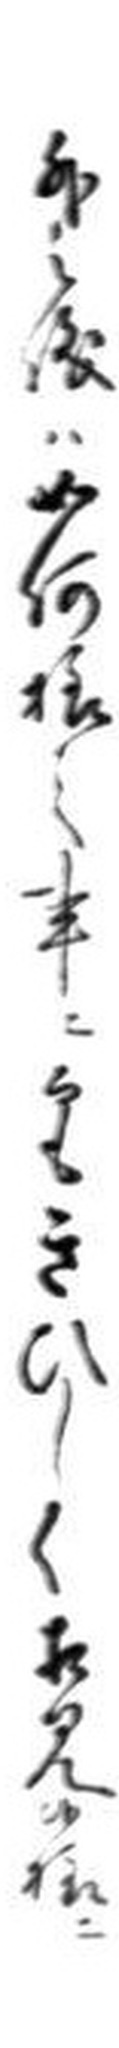外之儀ハ如何様之事ニ而もきひしく相見候様ニ
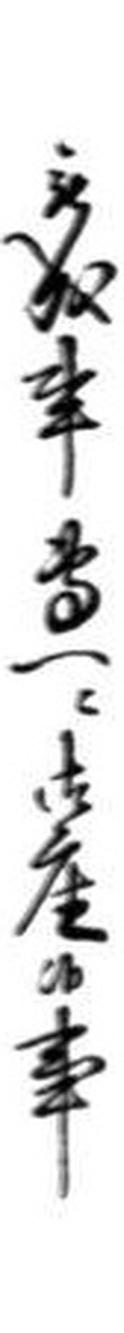被成事専一ニ御座候事
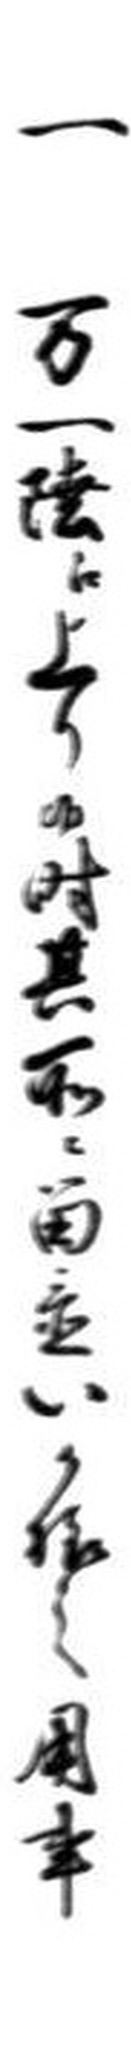一万一陸江上り候時其所ニ留置いか様之用事
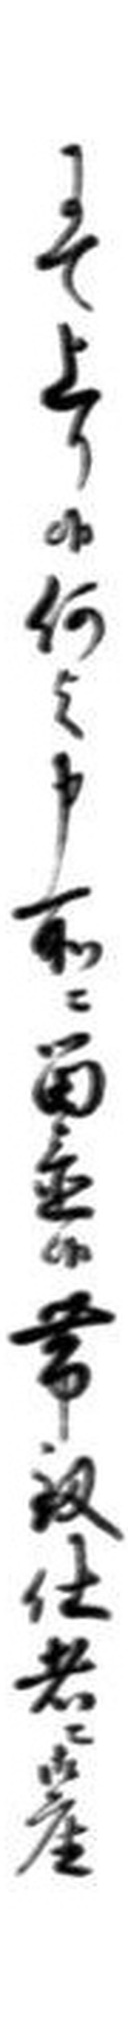にて上り候何与申所ニ留置候帯剣仕者ニ御座
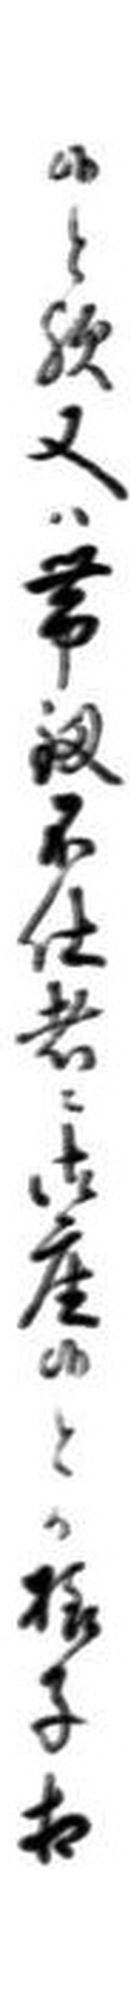候と歟又ハ帯剣不仕者ニ御座候とか様子相
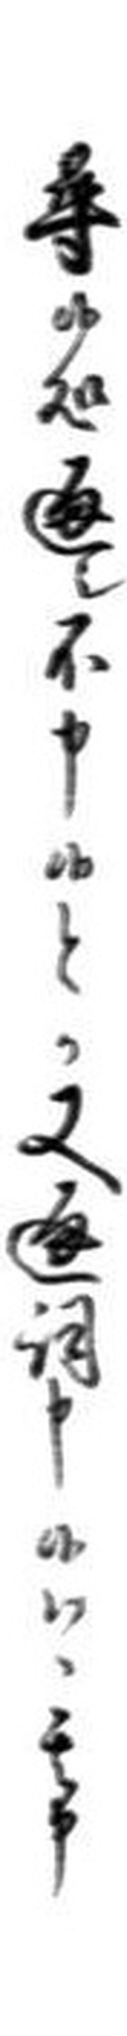尋候処通シ不申候とか又通詞申候ハヽ其申
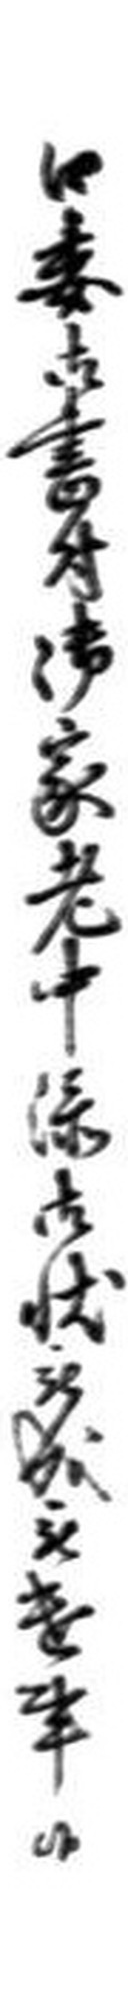口委御書付御家老中添御状被成被遣事候
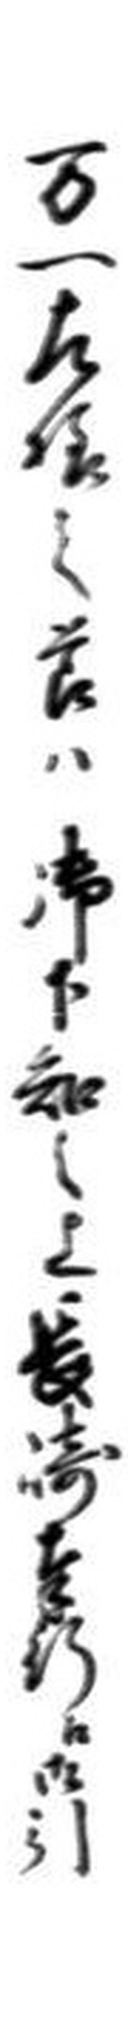万一左様之節ハ御下知之上長崎奉行江御引
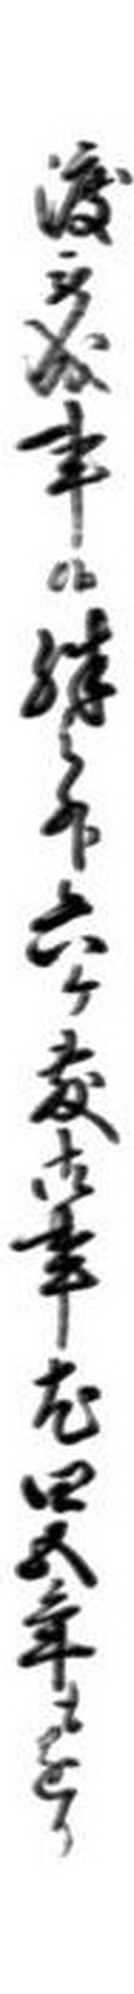渡被成事候殊之外六ケ敷御事尤四五年も懸り
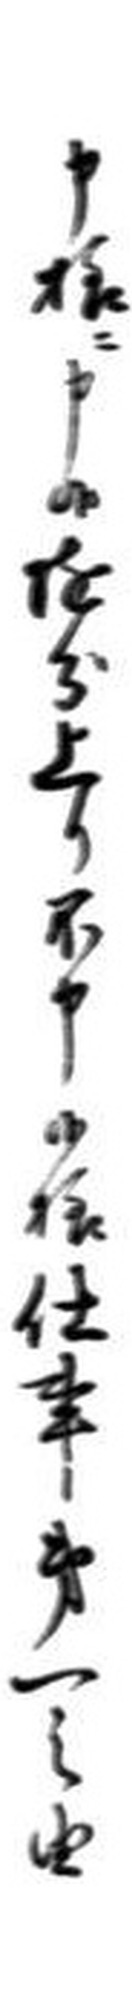申様ニ申候随分上り不申候様仕事第一之由

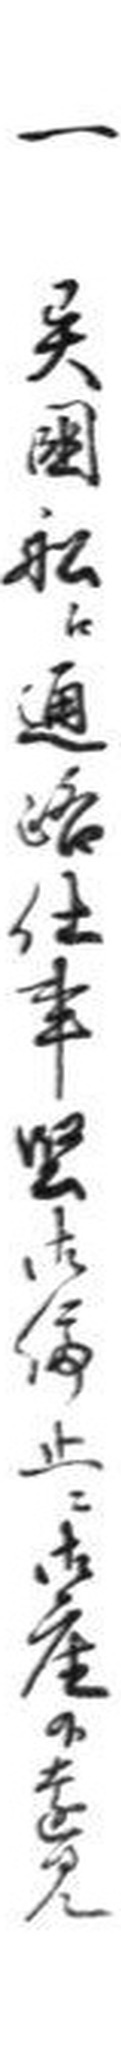一異国船江通路仕事堅御停止ニ御座候遠見
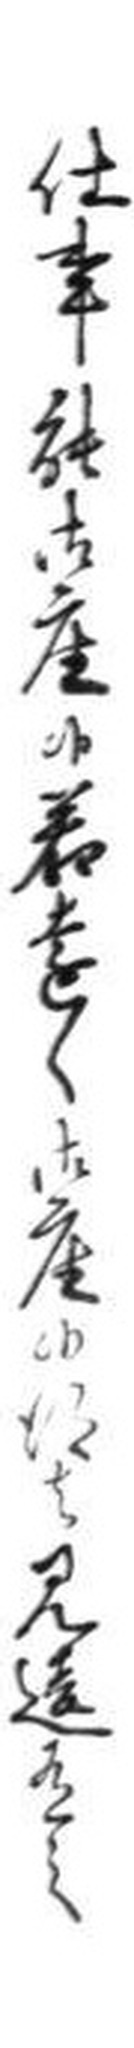仕事能御座候若遠く御座候得者見違有之
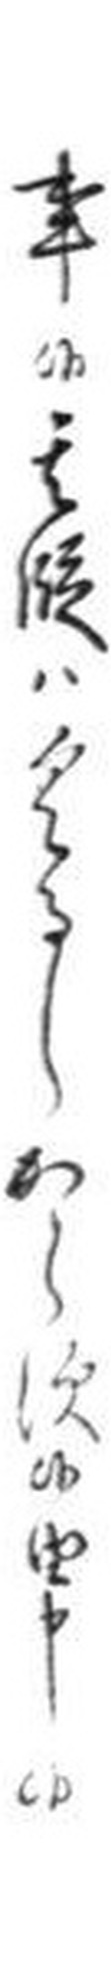事候其段ハくるしからす候由申候
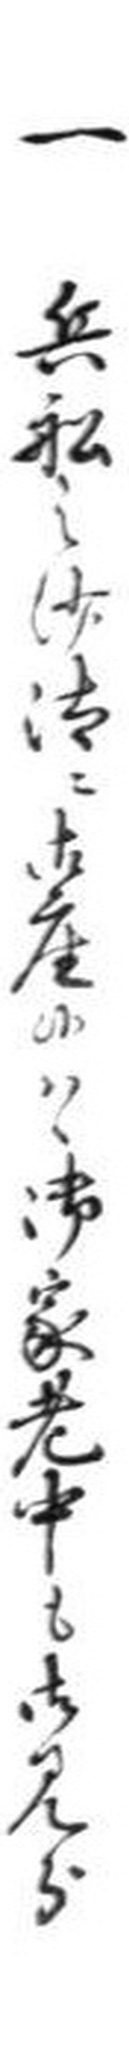一兵船之沙汰ニ御座候ハヽ御家老中も御見分
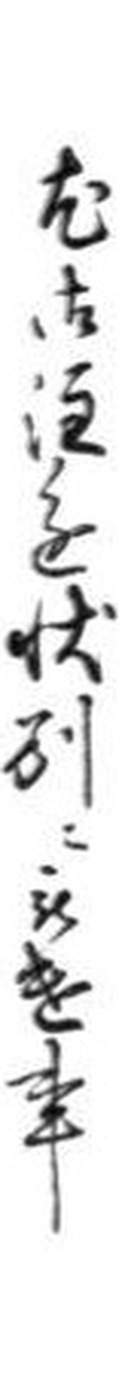尤御注進状別ニ被遣事
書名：家譜 三十二 吉邦公 従享保二年到享保三年
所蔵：福井県文書館 Fukui Prefectural Archives
